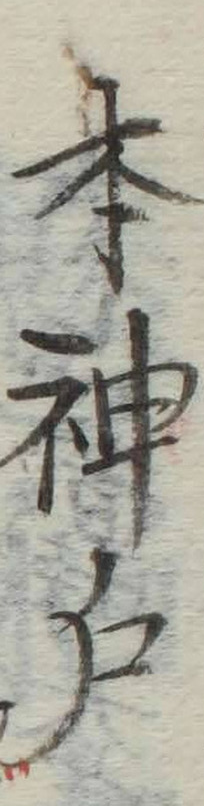本神戸
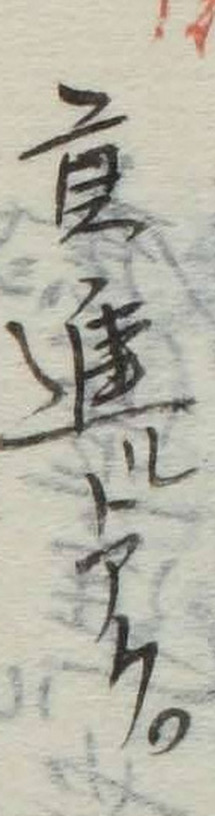貢進ルトアリ。
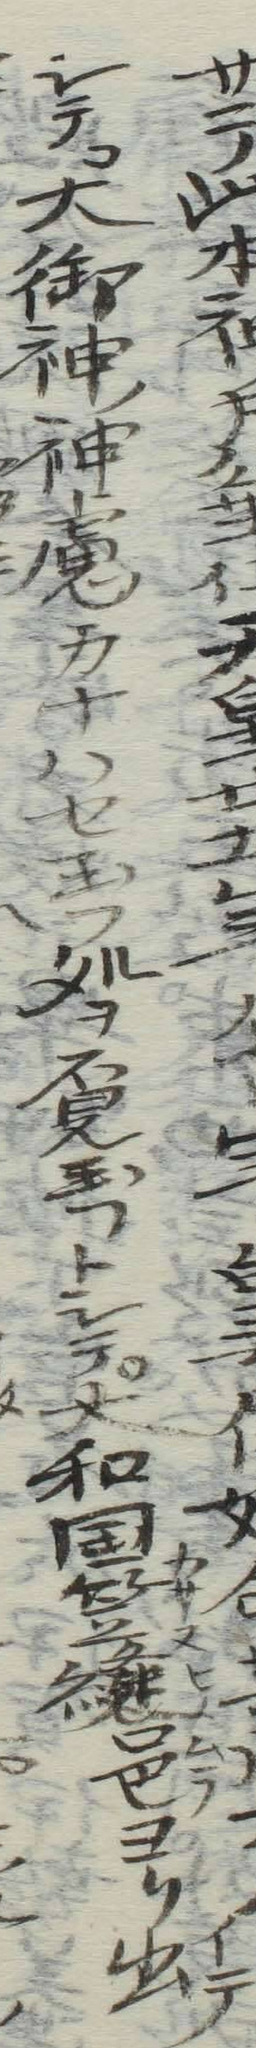シテ。大御神神慮カナハセ玉フ処ヲ不見玉フトシテ。大和国笠縫邑ヨリ出
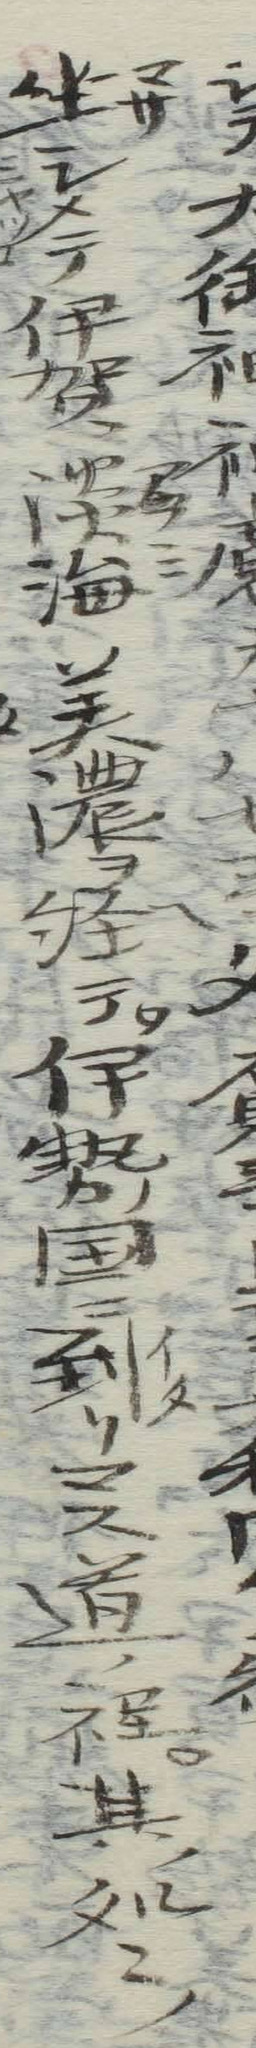坐シメテ伊賀淡海美濃ヲ経テ。伊勢国ニ到道ノ程。其処々
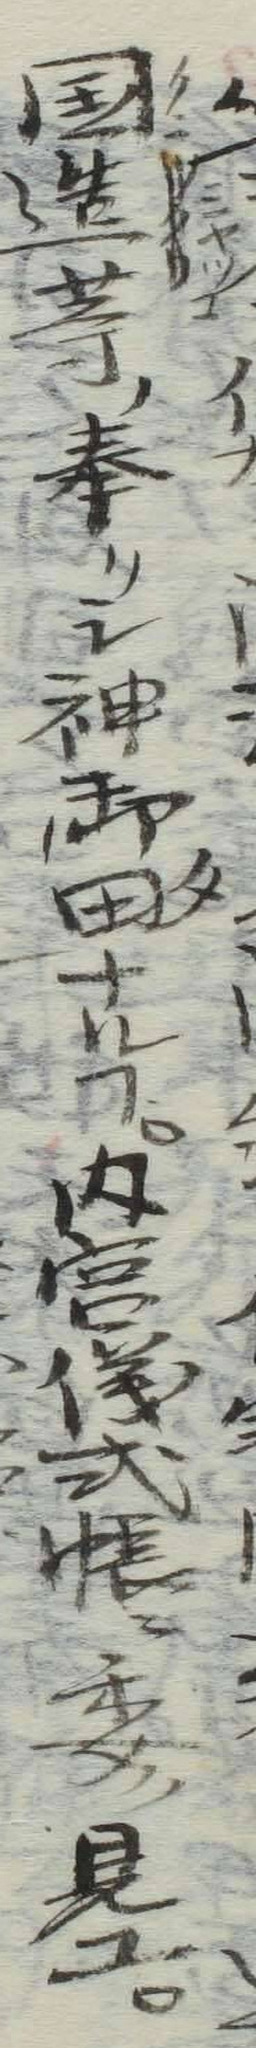国造等奉リシ神御田ナルコト。内宮儀式帳委ク見ユ。
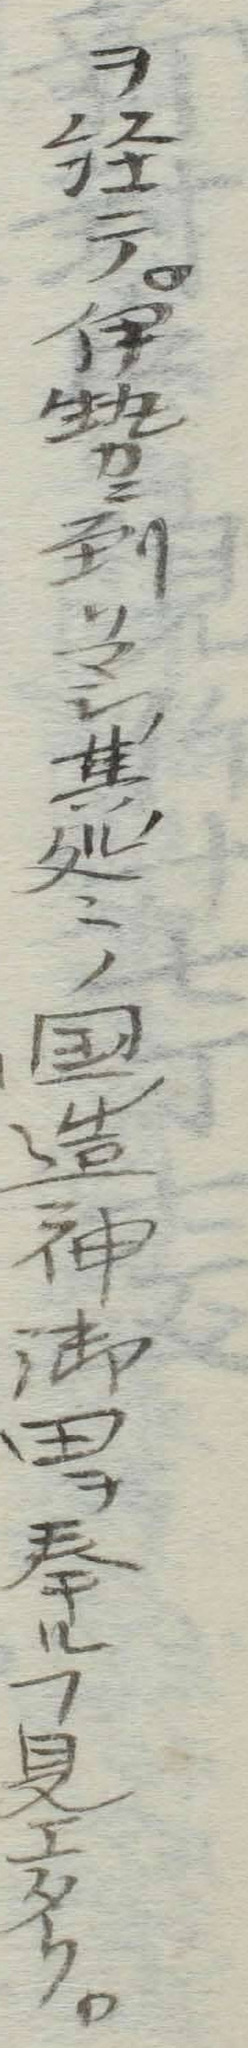ヲ経テ。伊勢ニ到リマシ其処々ノ国造神御田ヲ奉ルコト見エタリ。
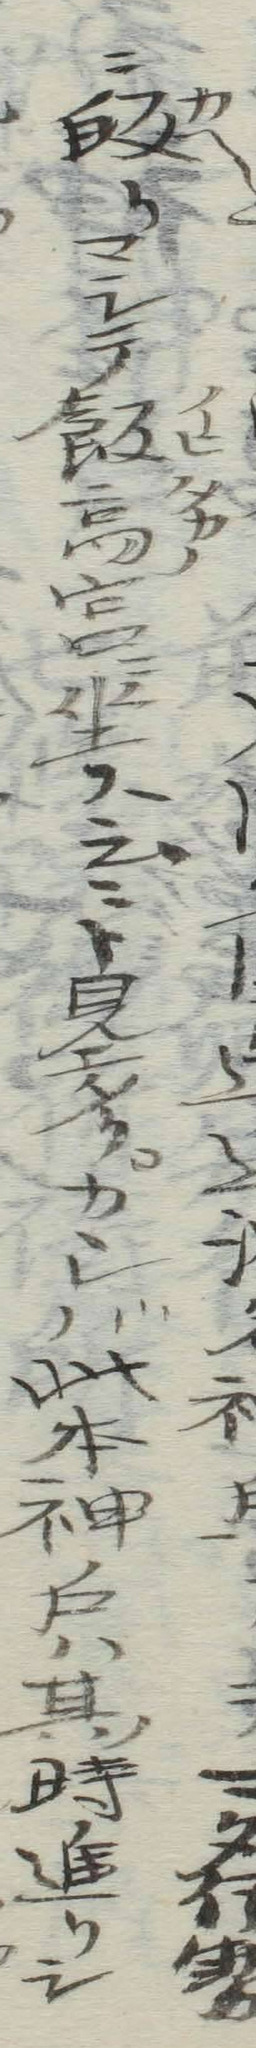ニ帰リマシテ飯高宮坐ス云々ト見エタリ。カヽレバ此本神戸ハ其時進リシ
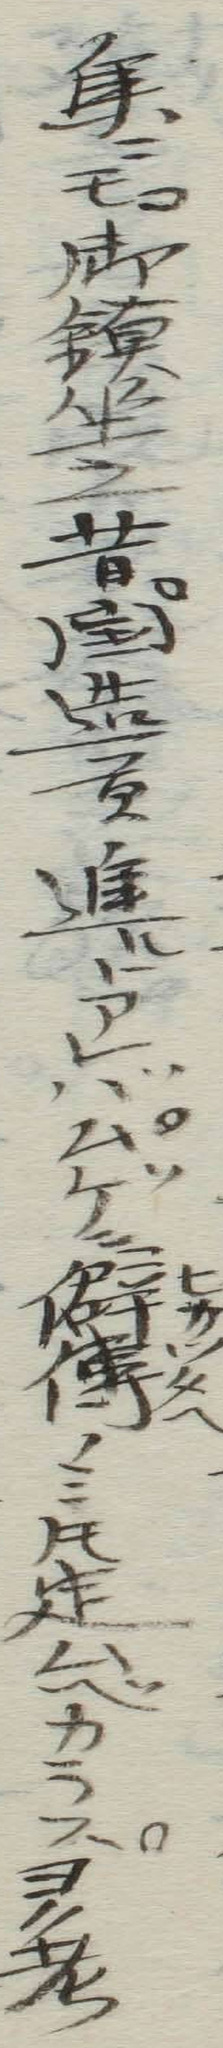集ニモ。御鎮坐之昔。国造貢進ルトアレバ。ムゲニ僻伝ノミトモ定ムベカラス。ヨク考
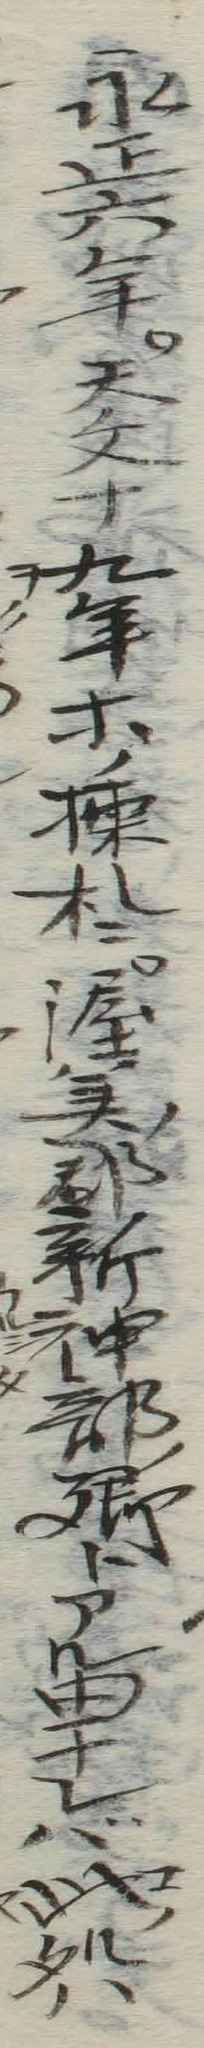永正六年。天文十九年等ノ棟札ニ。渥美郡新神戸郷トアル由ナレバ此処ハ
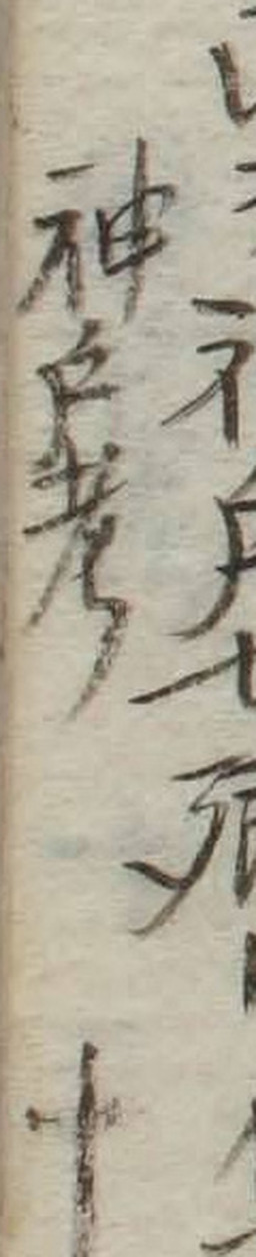神戸考十
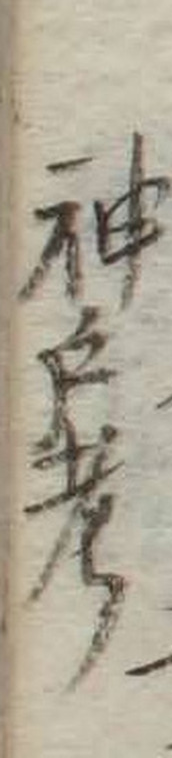神戸考十

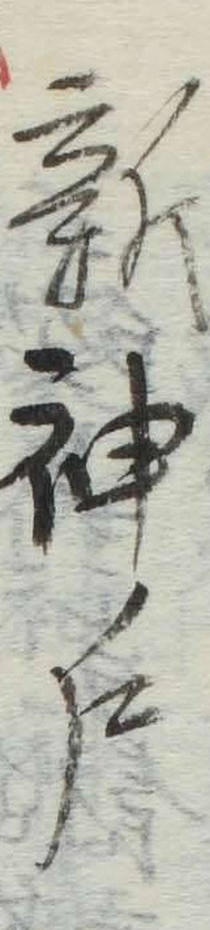新神戸
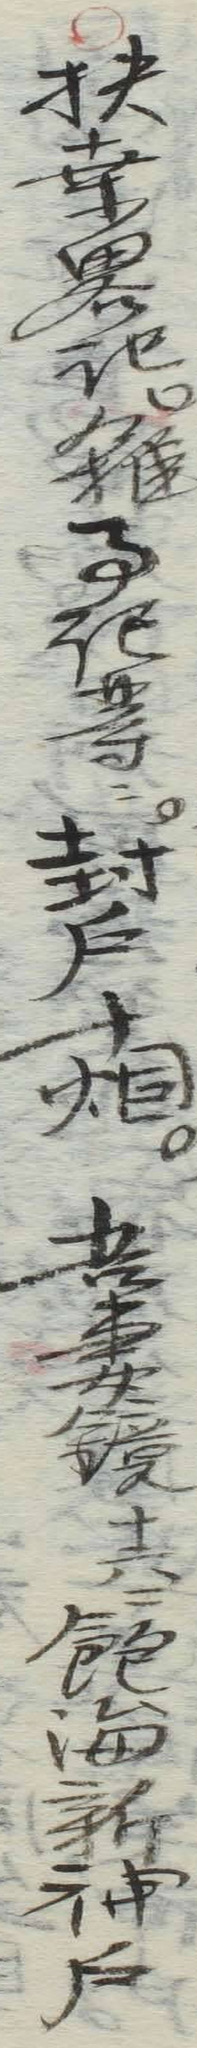○扶桑略記。雑事記等ニ。封戸十烟。吾妻鏡十六ニ飽海新神戸
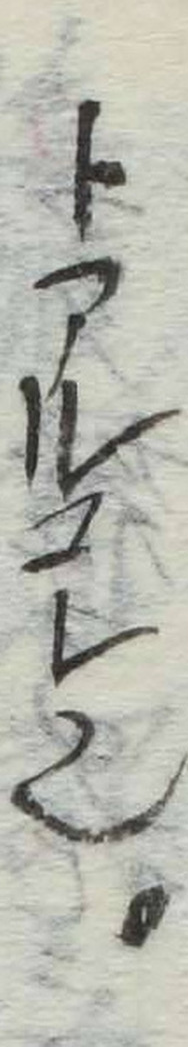トアルコレ也。
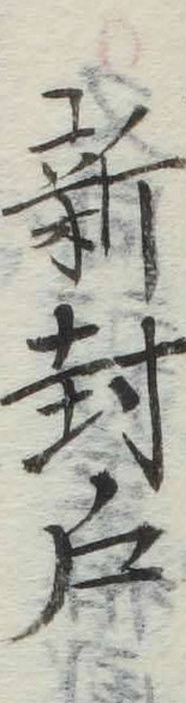新封戸
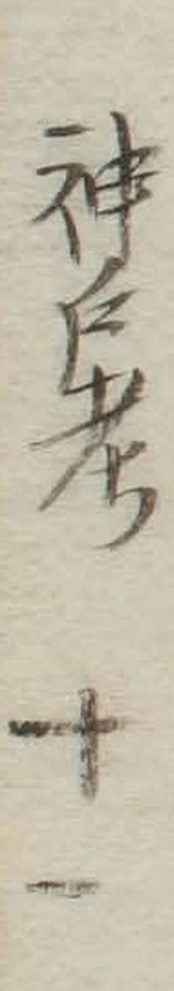神戸考十一
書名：神戸御厨御薗考
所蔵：国文学研究資料館
